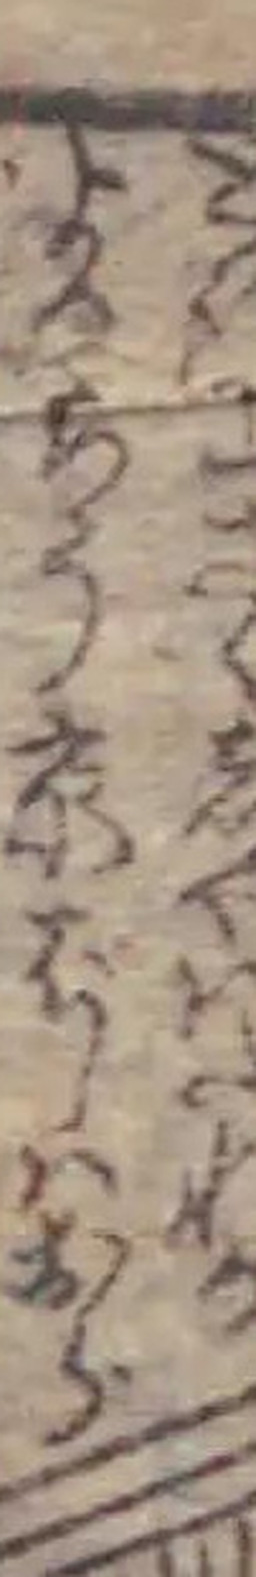よからう京ばしはおら
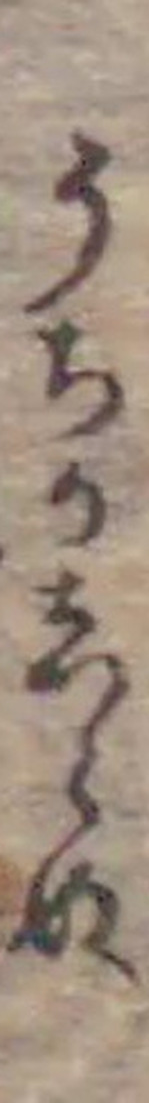うちかしらぬ
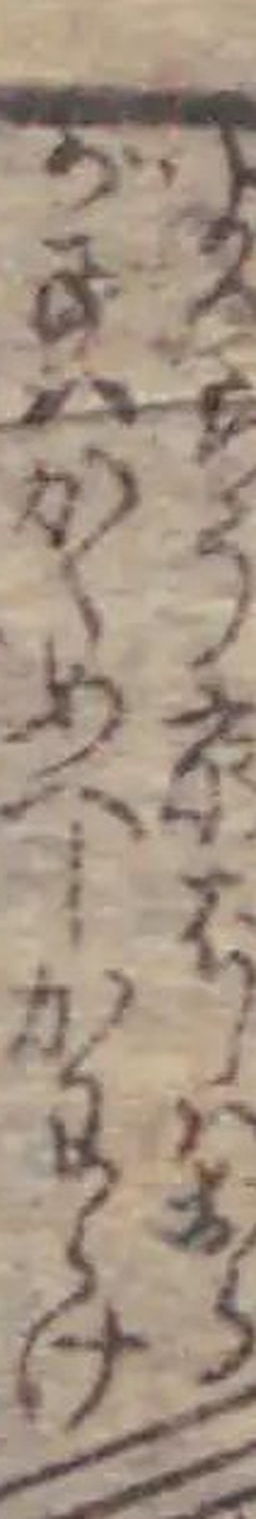が事はかくめへしかわらけ
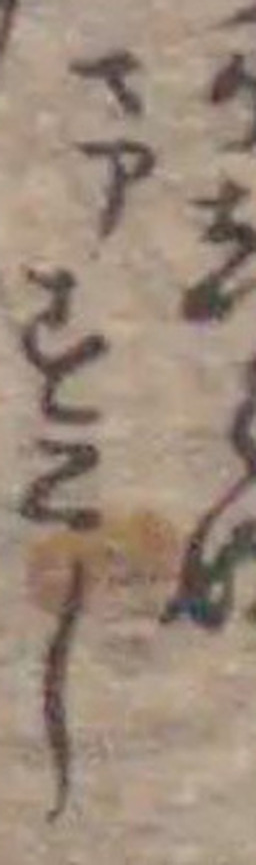マアすこし
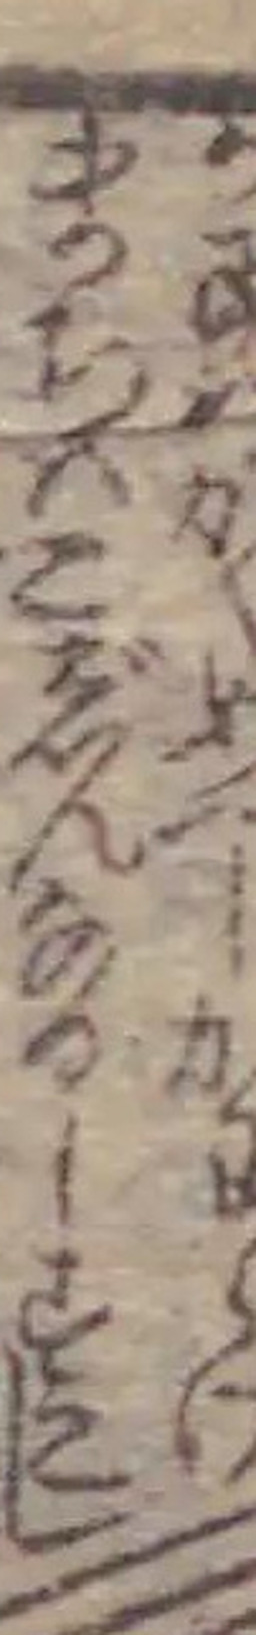まちはこじんなるしすこし
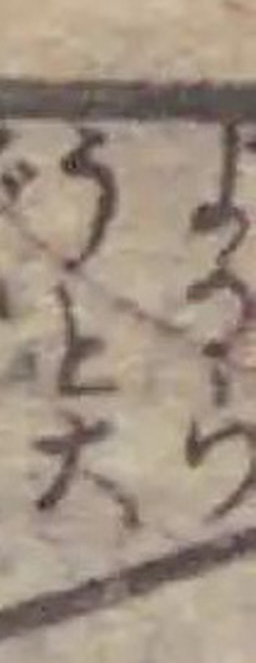うと大
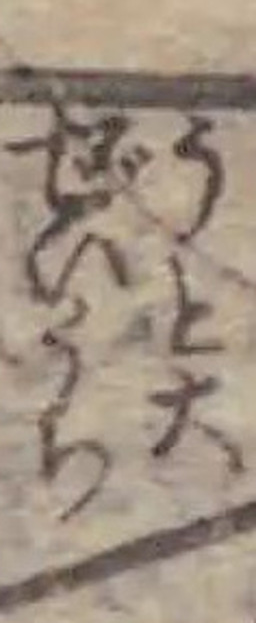ぜいうち
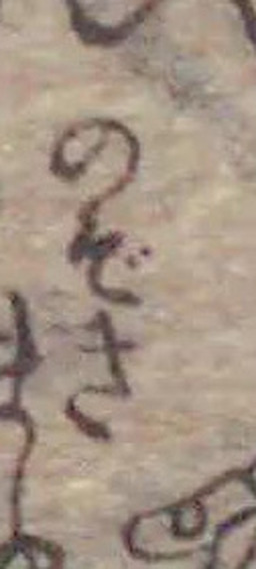のぞき
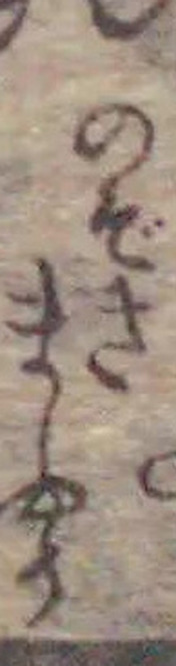のぞき
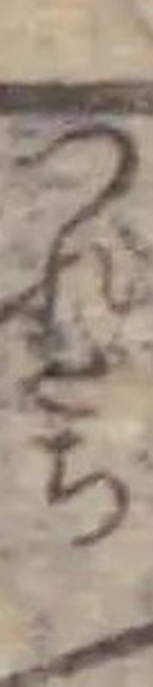つれたち
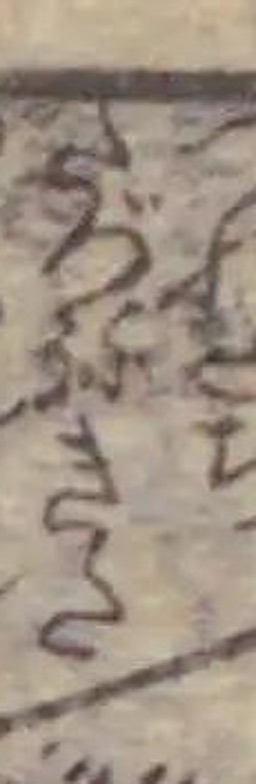たづねきた
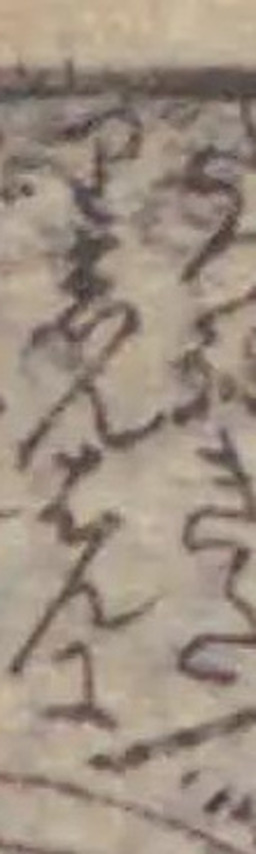りしんはんに
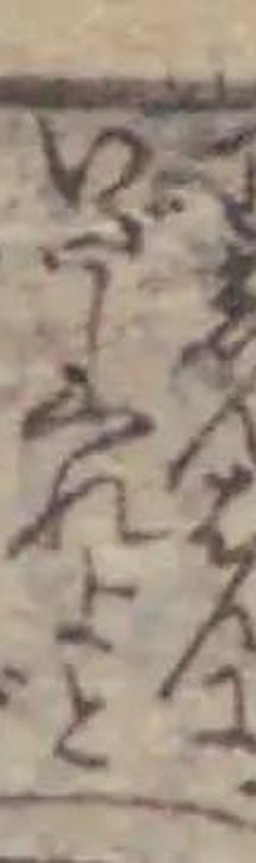いだしくれよと
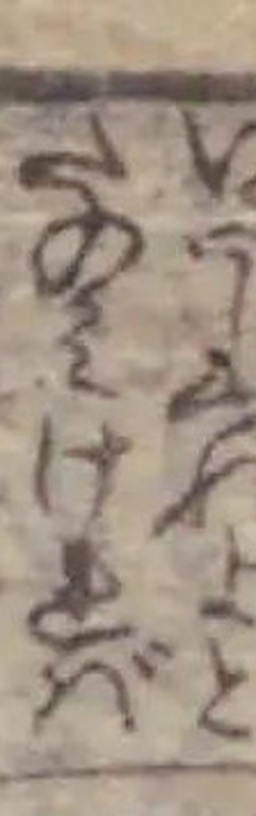たのみければ
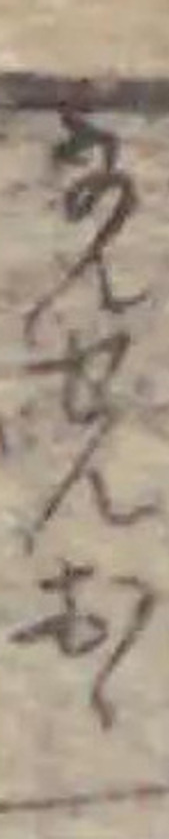なんせんおゝ
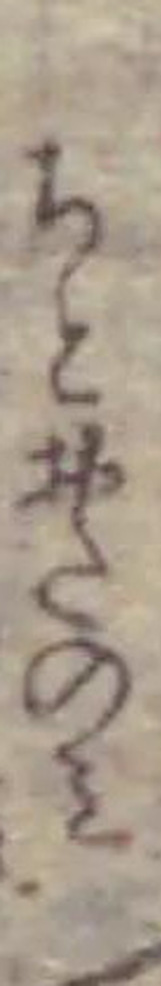ちと物たのみ
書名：化物大閉口 2巻
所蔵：国立国会図書館 National Diet Library, JAPAN
